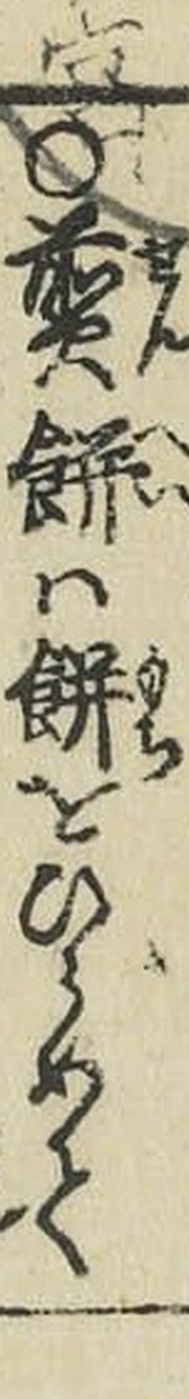○煎餅は餅をひらめて
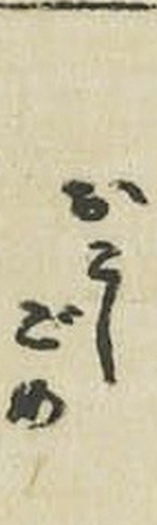おこしごめ
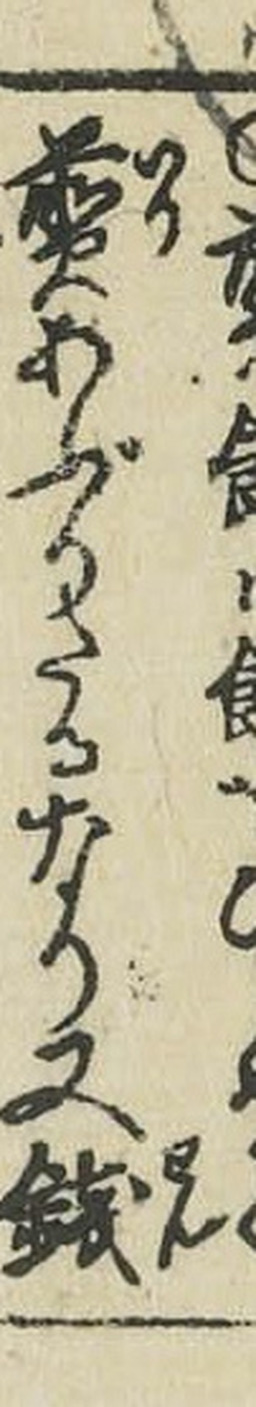煎あぶりたるなり又銭
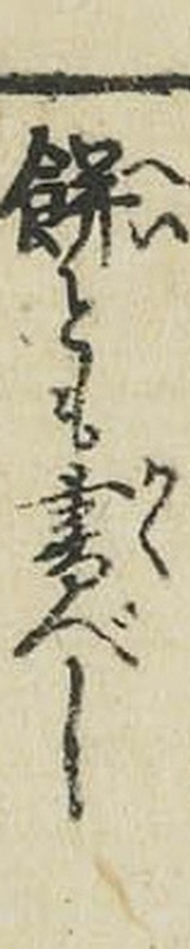餅とも書べし
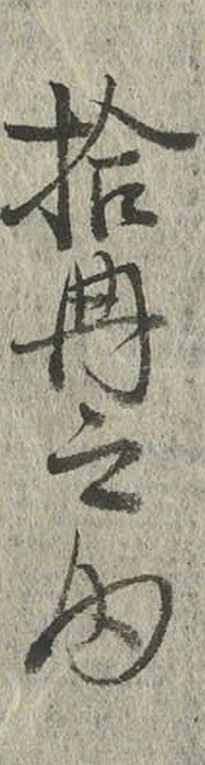拾冊之内
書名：増補頭書訓蒙図彙大成 10巻 7:巻之14-16
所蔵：東京学芸大学教育コンテンツアーカイブ
